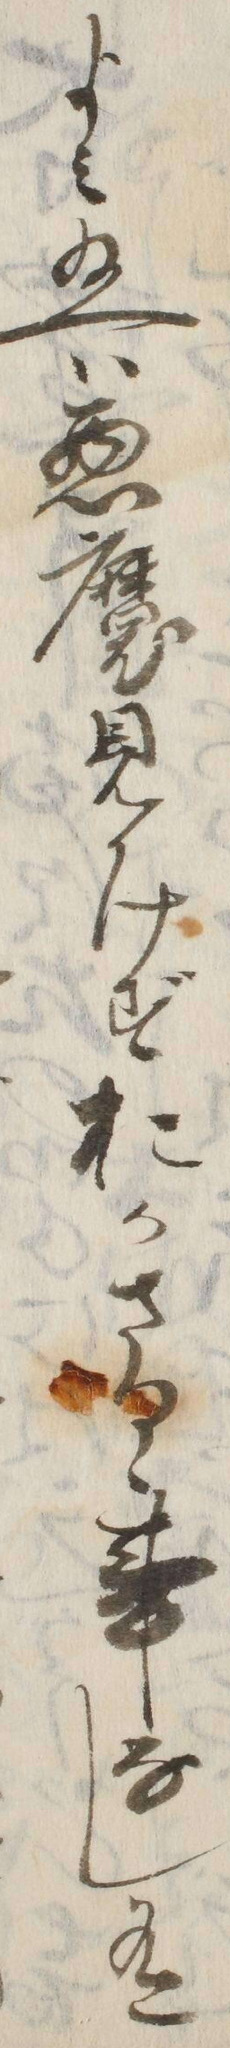よみ給へは悪魔見けずおかさるゝ事なし有
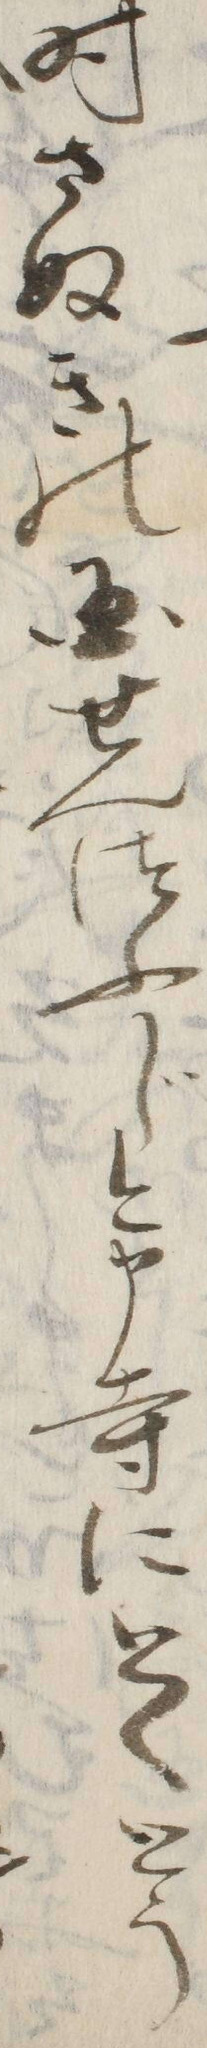時さぬきの国せんつふじと申寺にとくとう
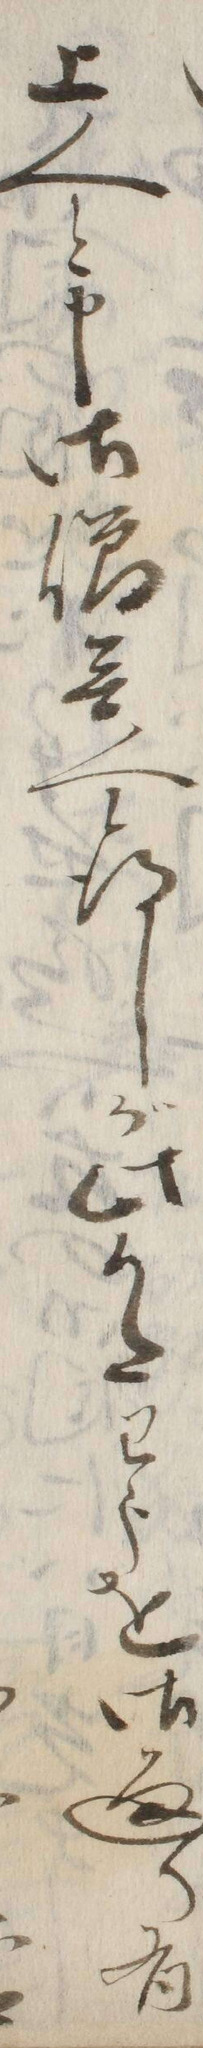上人と申御僧壱人候得しが此かたわらを御通り有
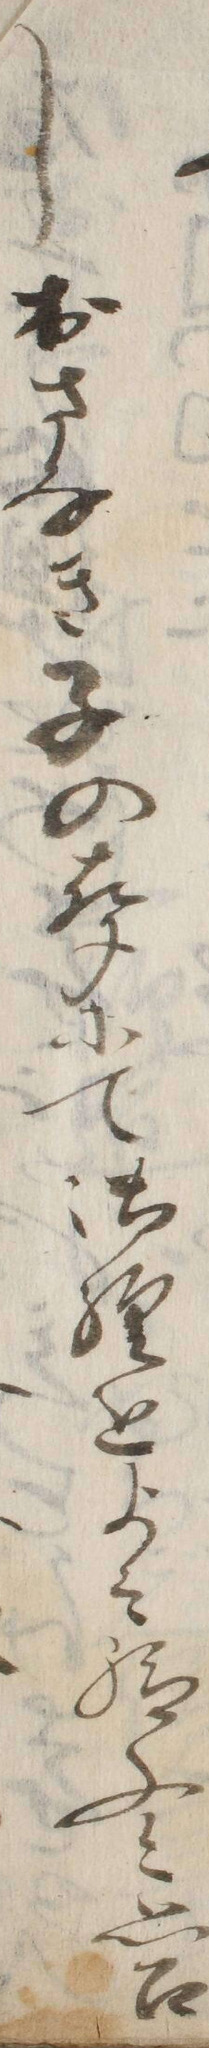しおさなき子の声にて御経をよみ給ふと思召
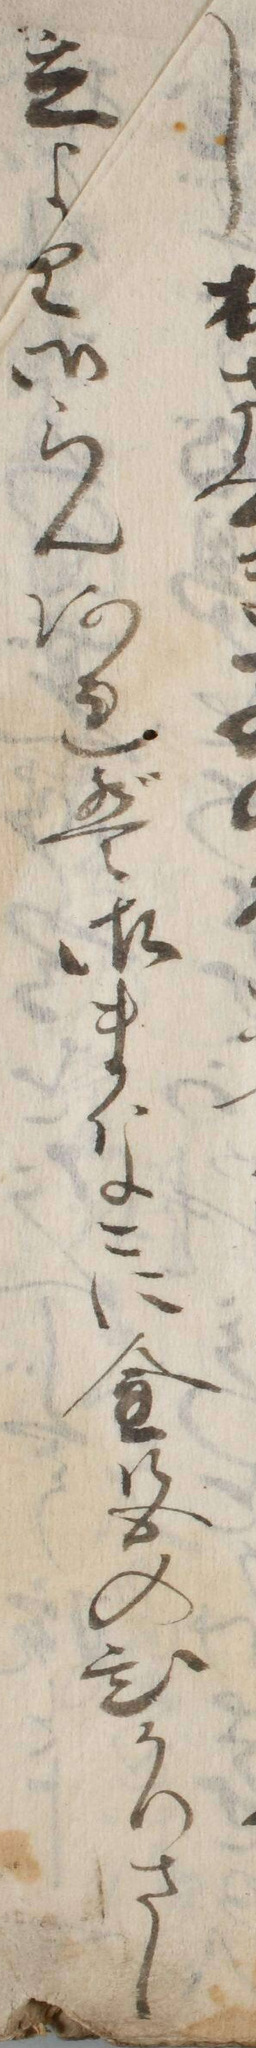立より御らんあれば御まなにこに金色のひかりさし
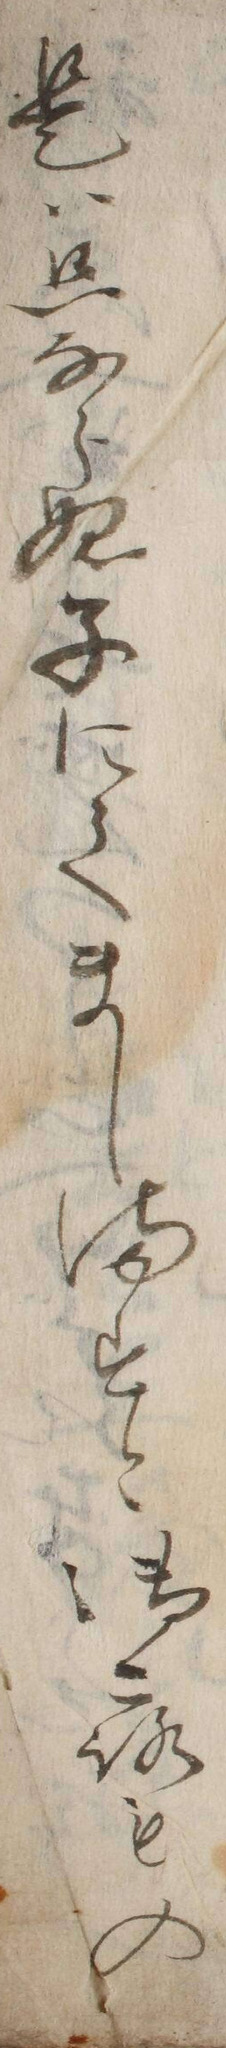是は只ならぬ子にてましますと御ころもの

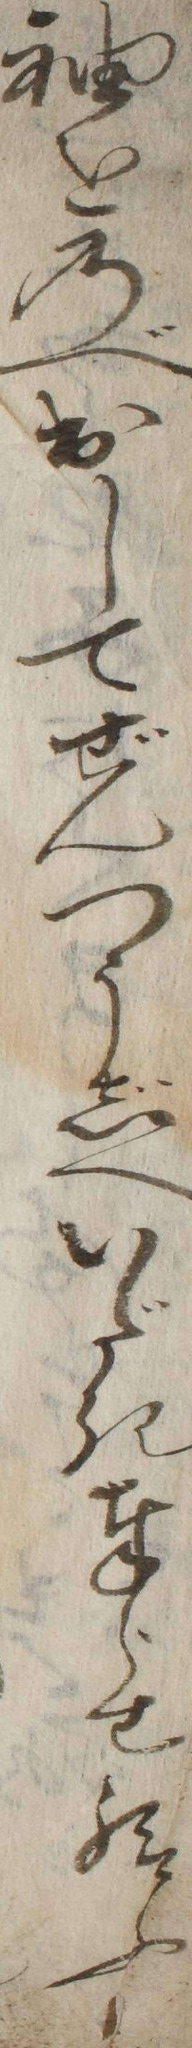袖をのべ出してぜんつうじへいだき奉らせ給ふ
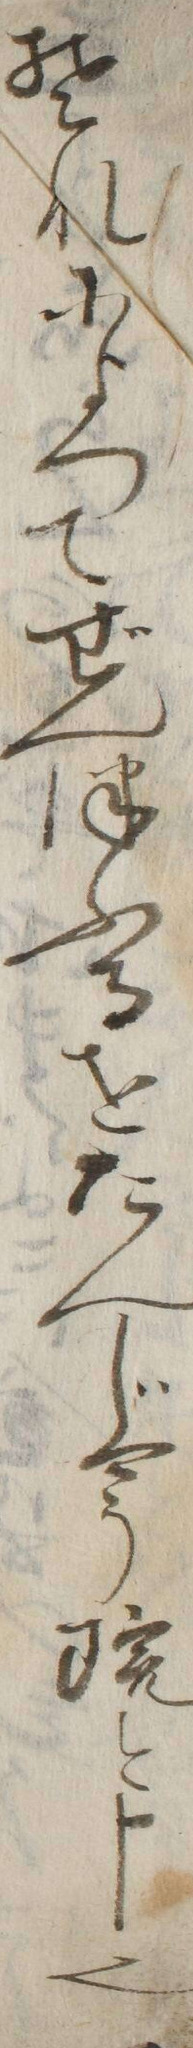それによつてせんつふ寺をたんじやう院と申也
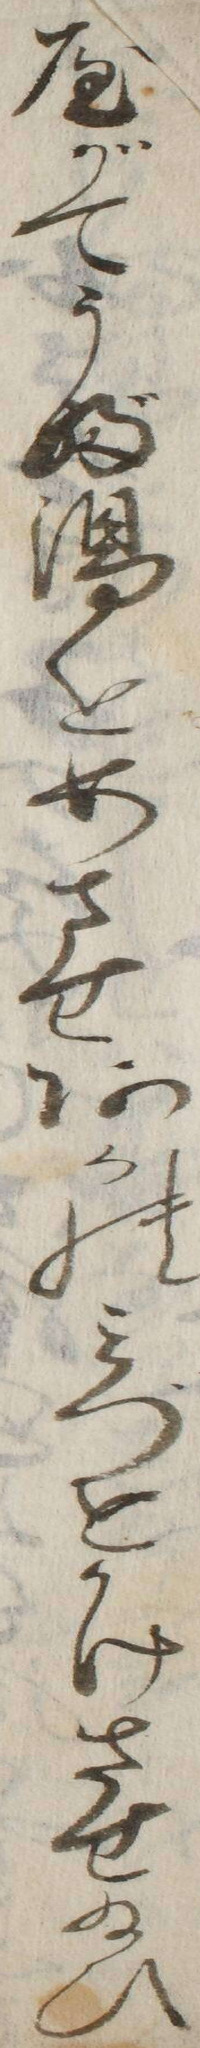やがてうふ湯をめさせあかのみづをかけさせ給ひ
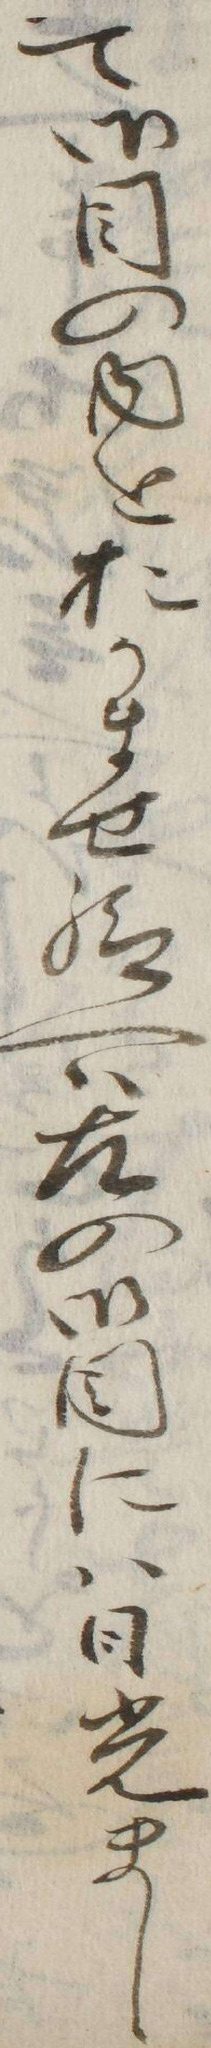て御目の内をおかませ給へは左の御目には日光まし
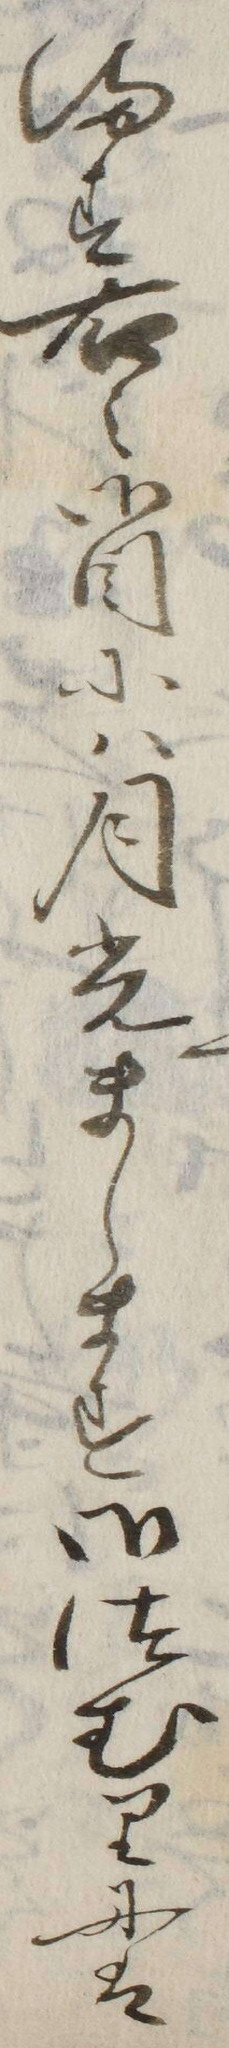ます右之御目には月光まします御つむりには
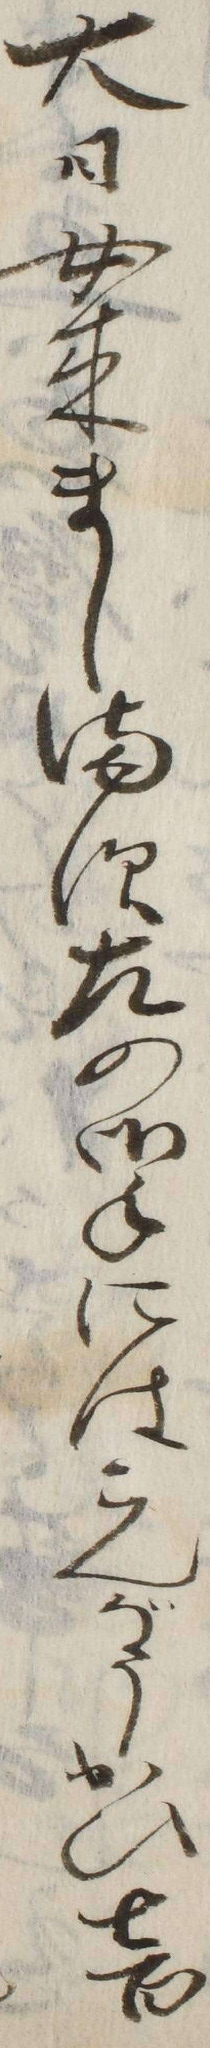大日如来まします左の御手にはこんかうかひ七百
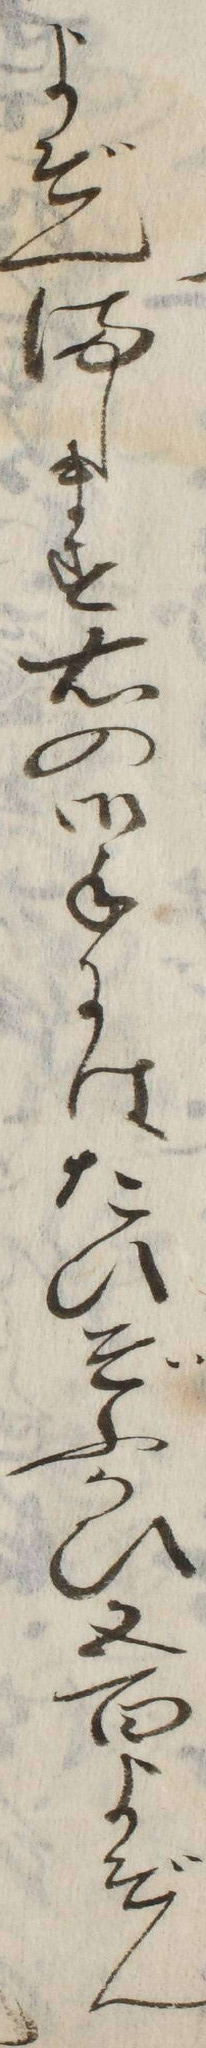よぞんまします右の御手にはたひぞふかひ五百よぞん
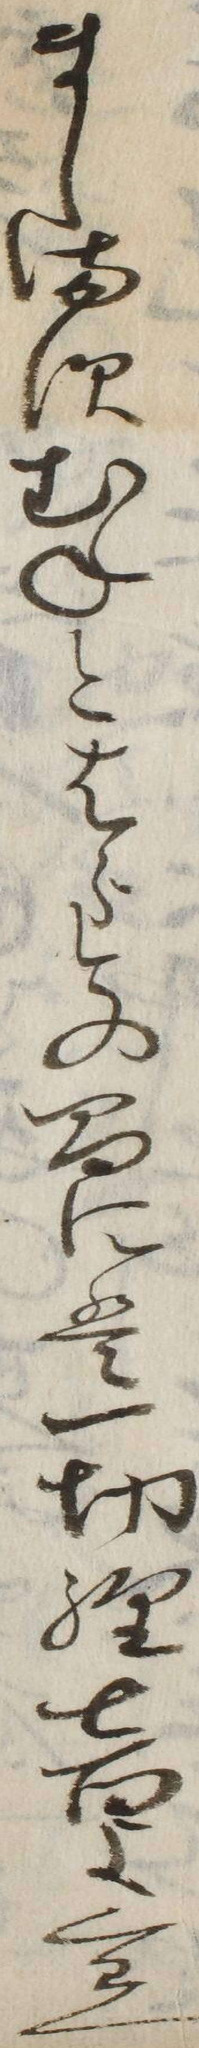ましますむねとはらとの間には一切経七百よくわん
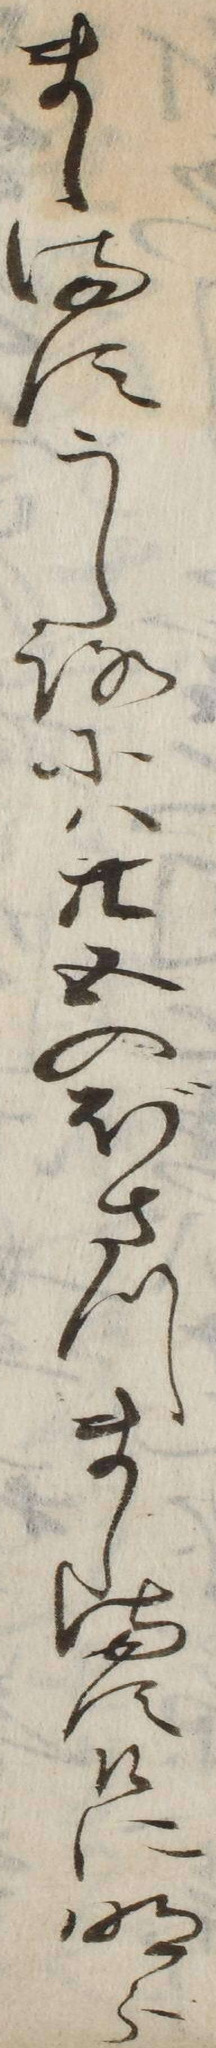ましますうしろには廿五のぼさつましますけに明ら
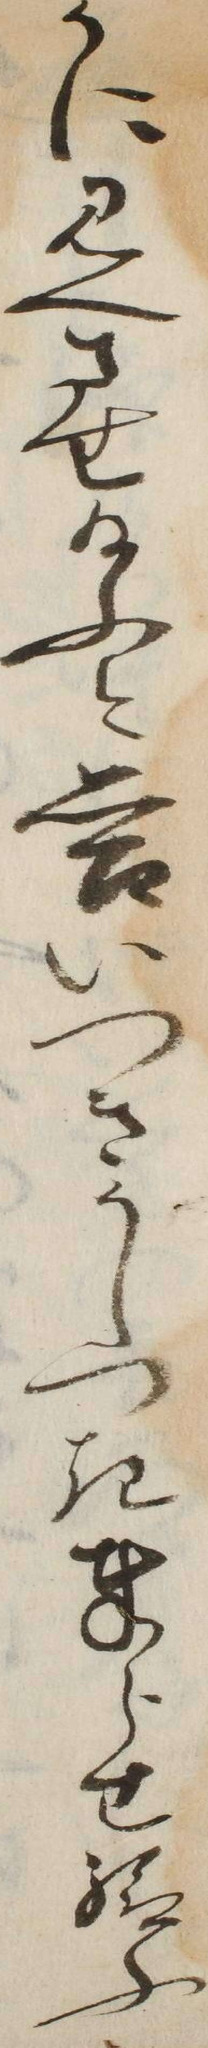かに見へさせ給ふと思召いつきかしつき奉らせ給ふ
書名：奉弘法大師御傳記
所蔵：国文学研究資料館
